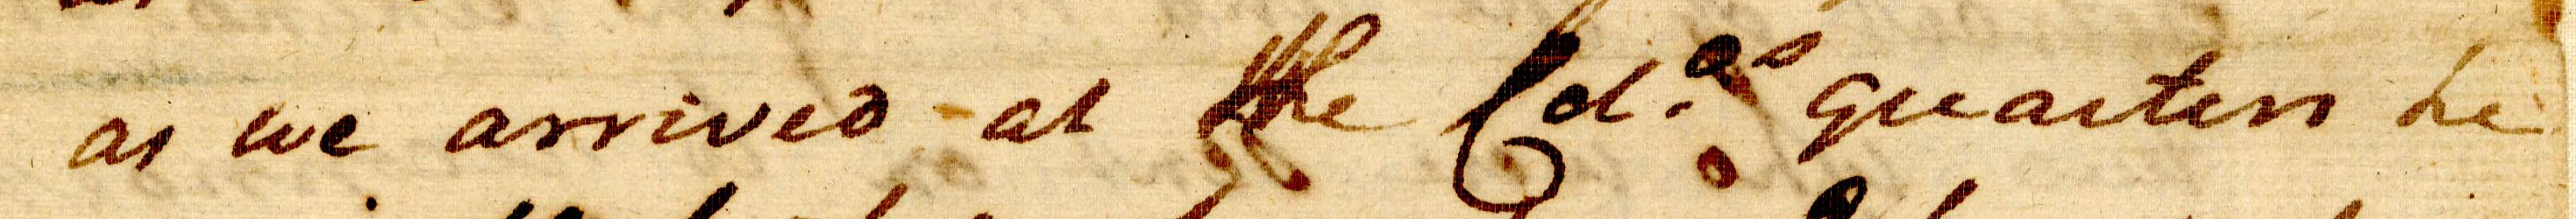as we arrived at the Col^os. quarters he
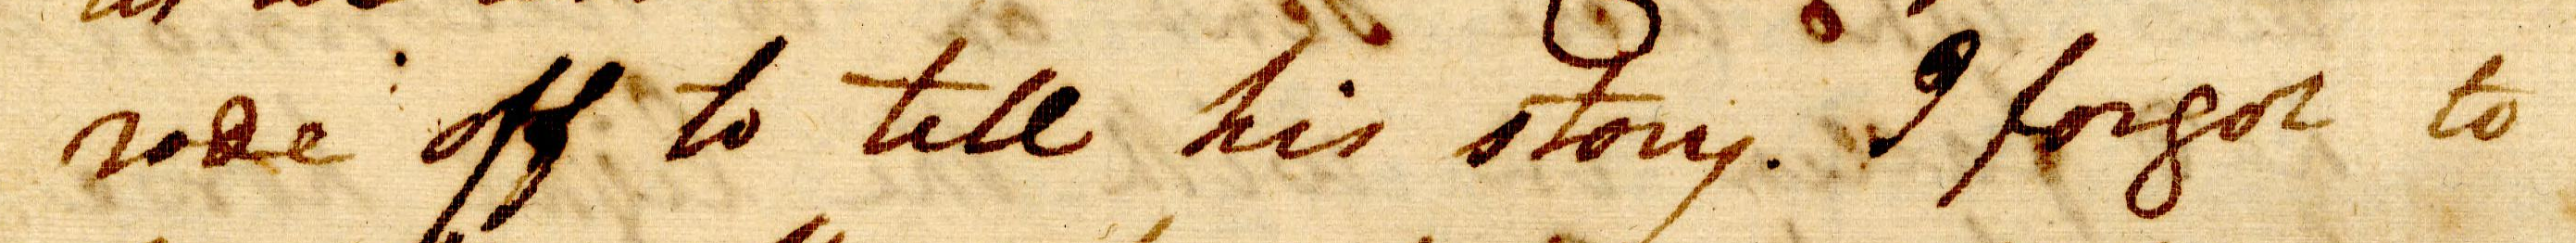rode off to tell his story. I forgot to
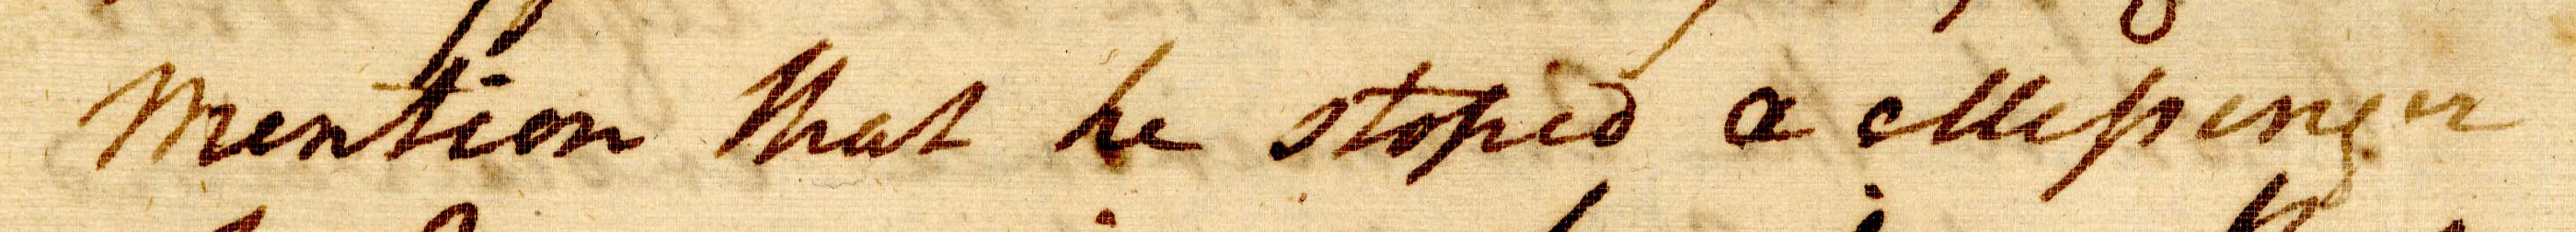Mention that he stoped a Messenger
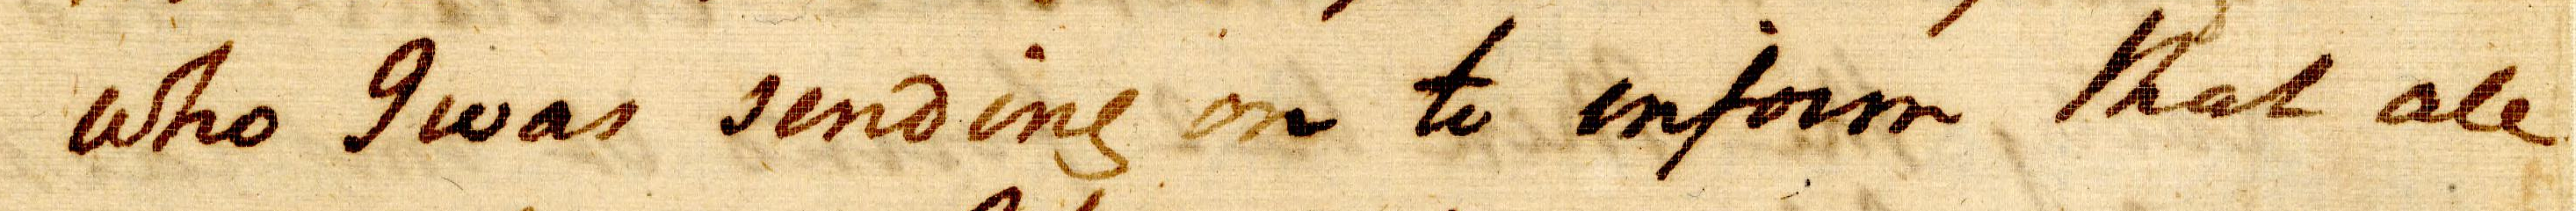who I was sending on to inform that all
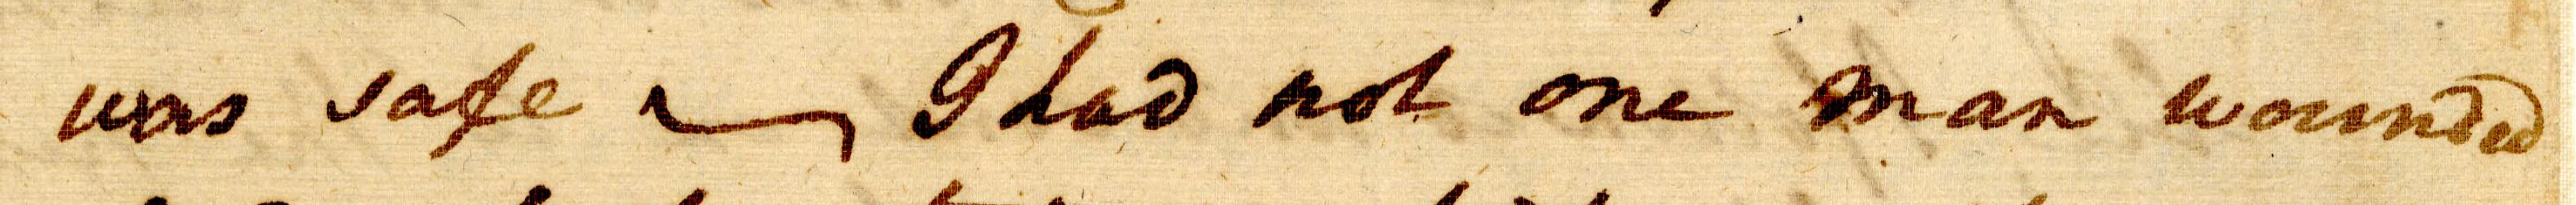was safe- I had not one man wounded
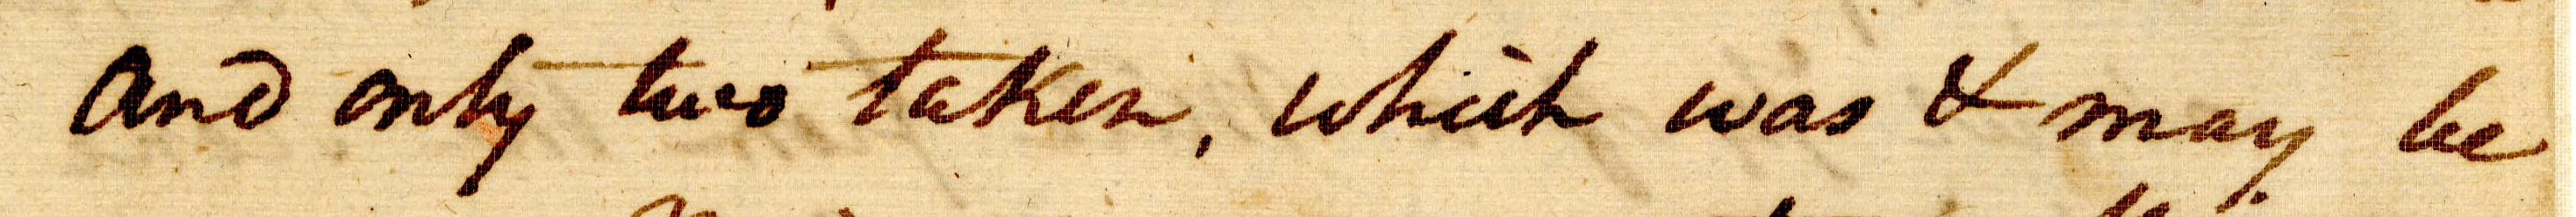and only two taken, which was & may be
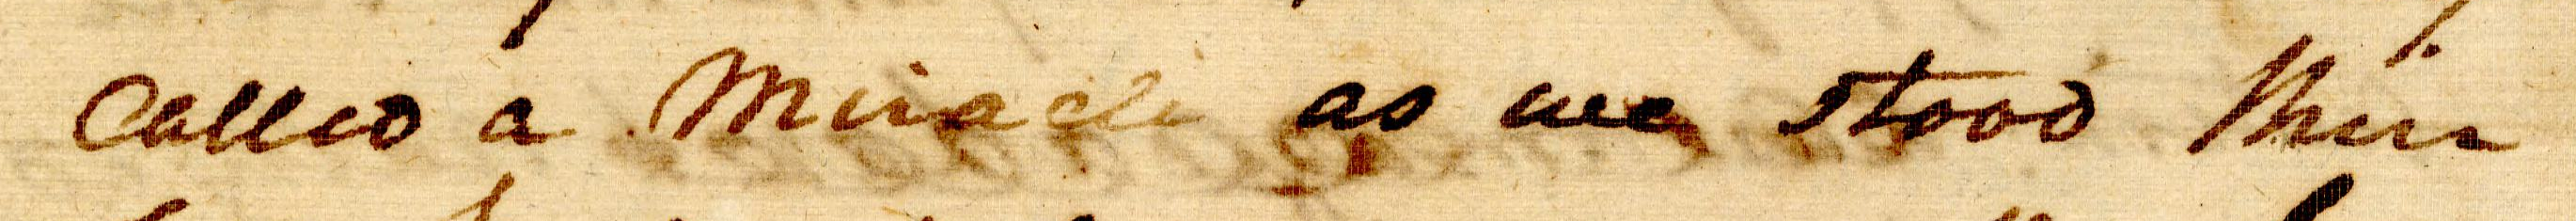called a Miracle as we stood their
